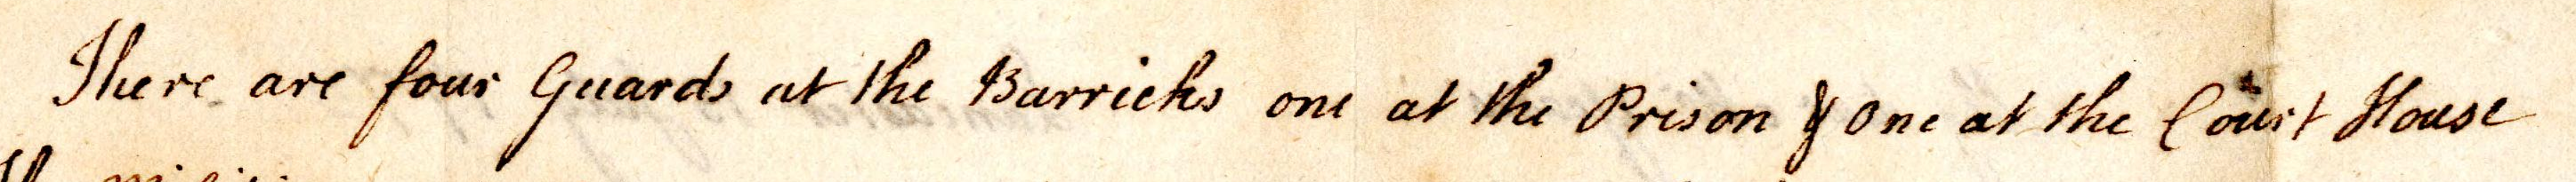There are four Guards at the Barricks one at the Prison & one at the Court House
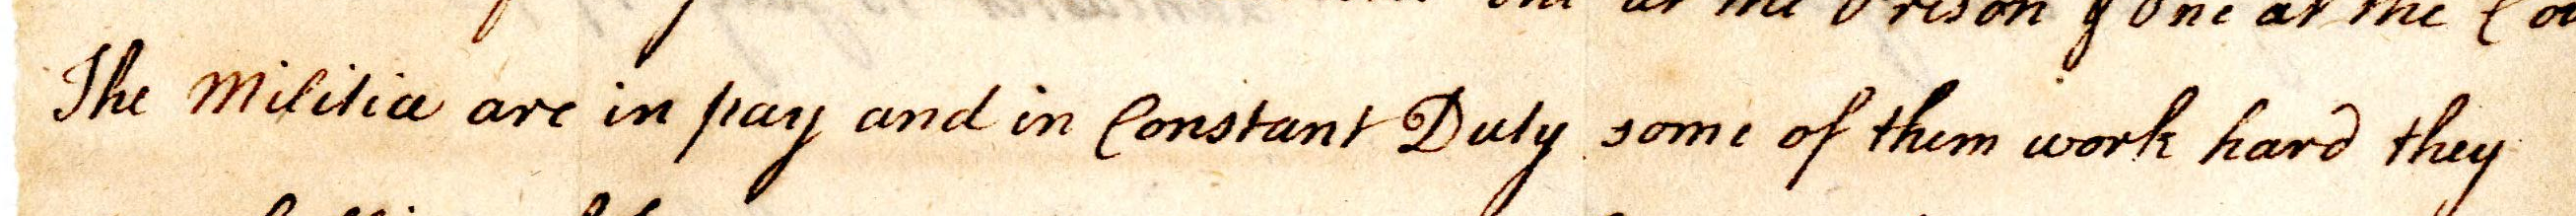The Militia are in pay and in Constant Duty some of them work hard they
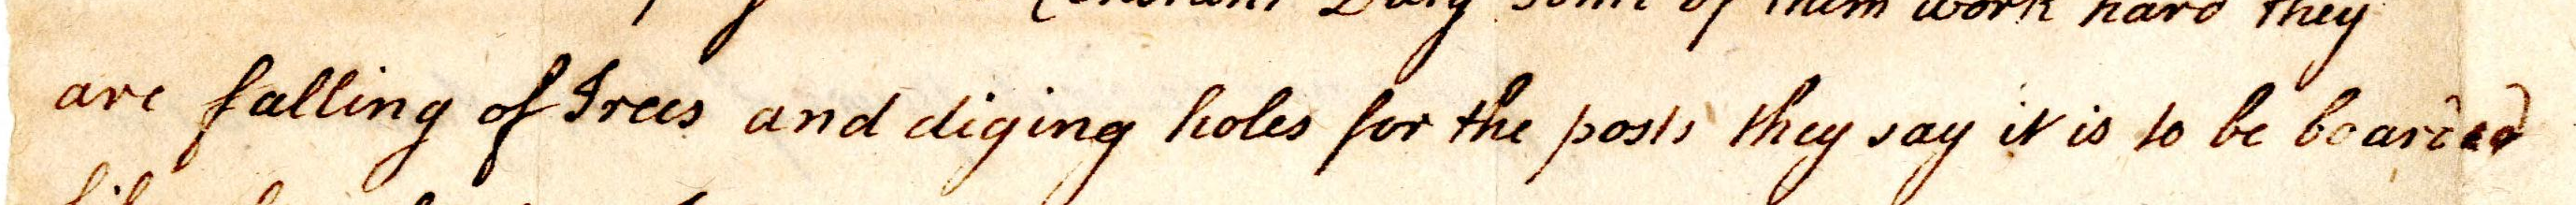are falling of Trees and diging holes for the posts they say it is to be boarded
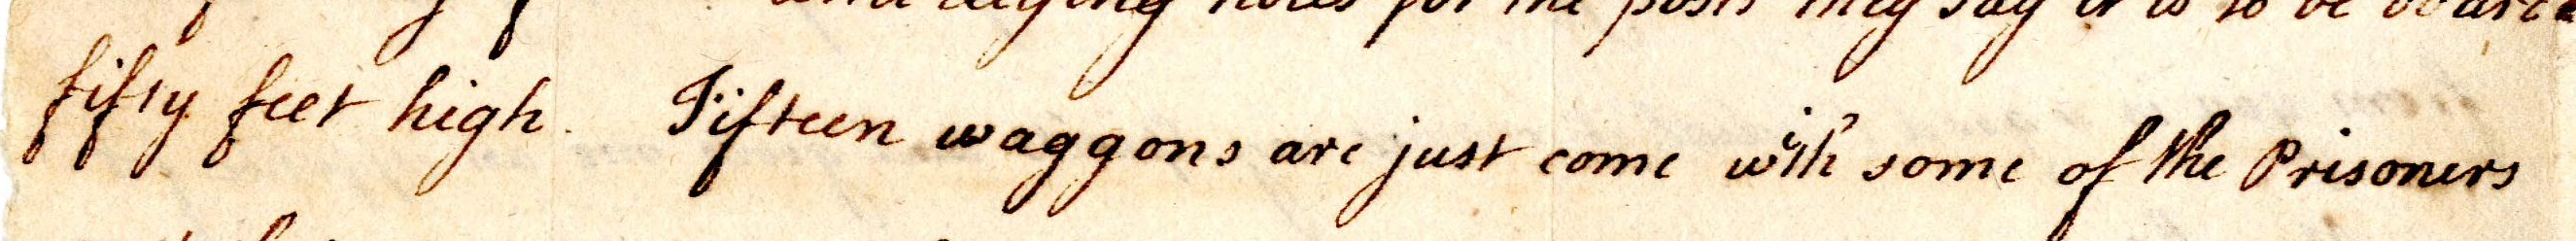fifty feet high. Fifteen waggons are just come with some of the Prisoners
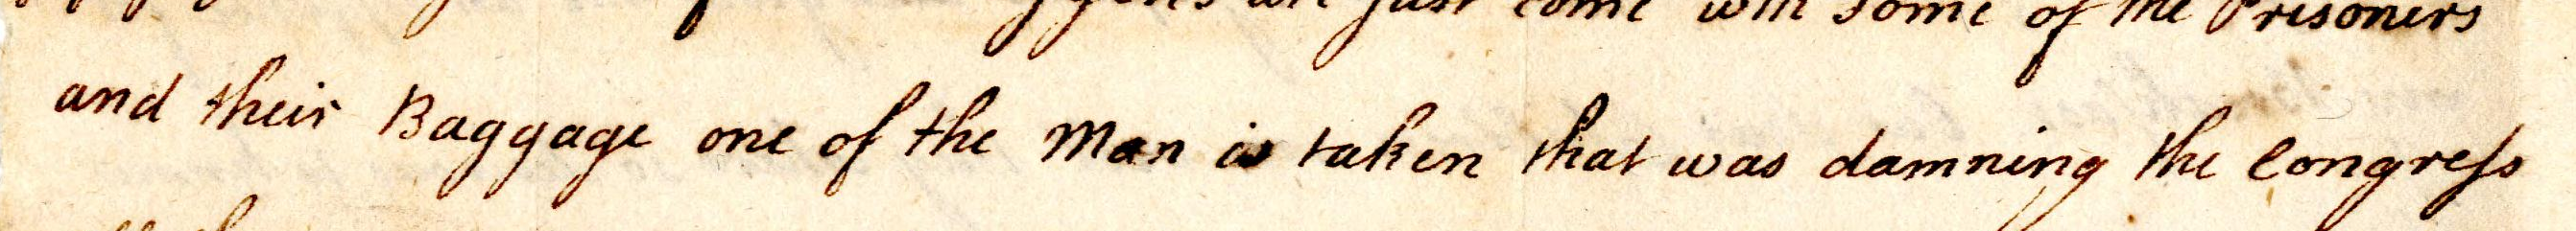and their Baggage one of the Man is taken that was damning the congress
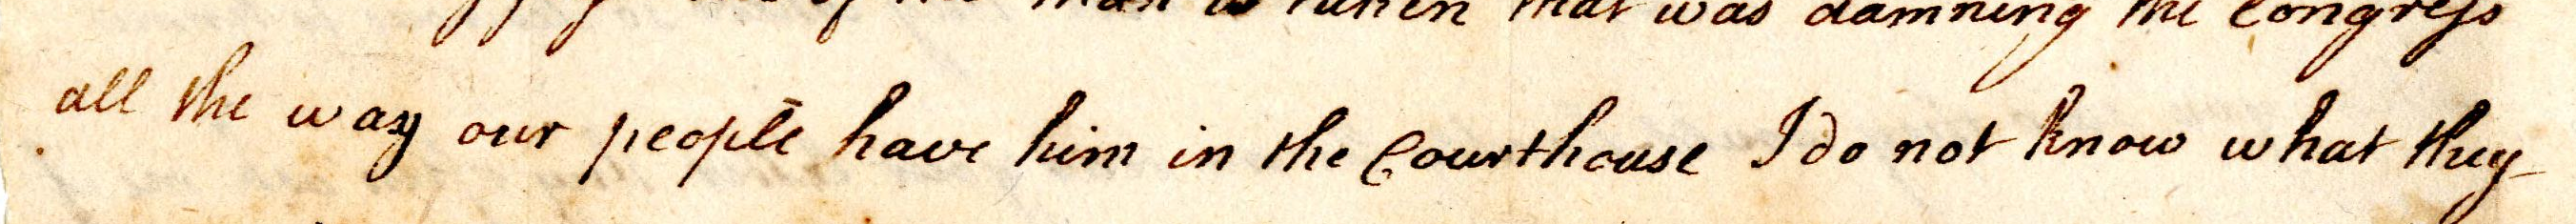all the way our people have him in the Courthouse I do not know what they
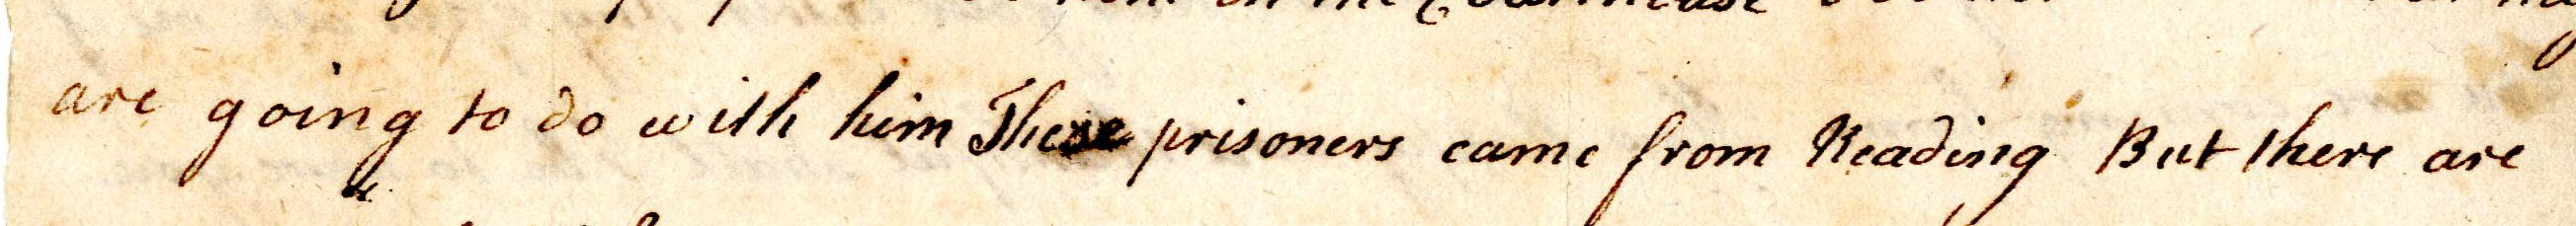are going to do with him These prisoners came from Reading But there are
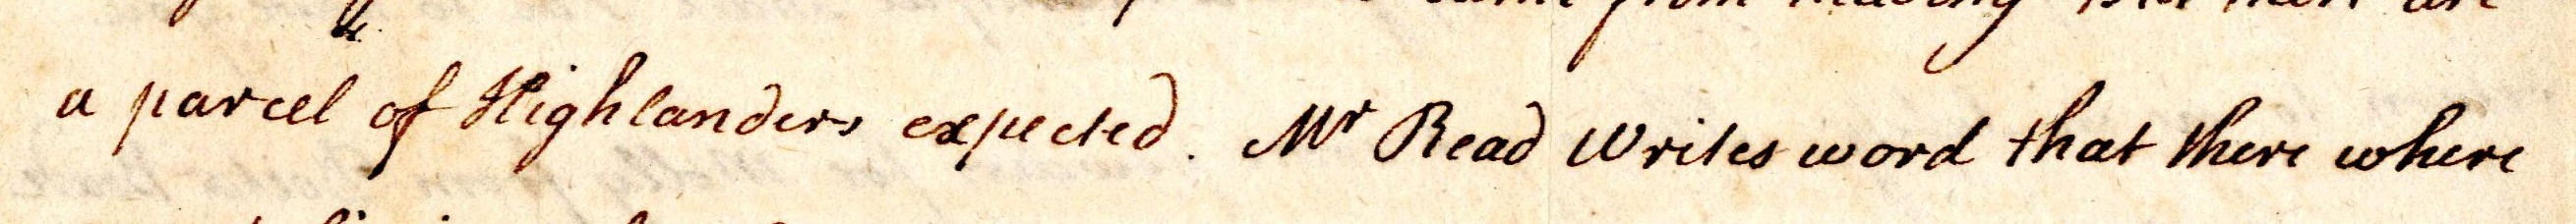a parcel of Highlanders expected, M^r Read writes word that there where
